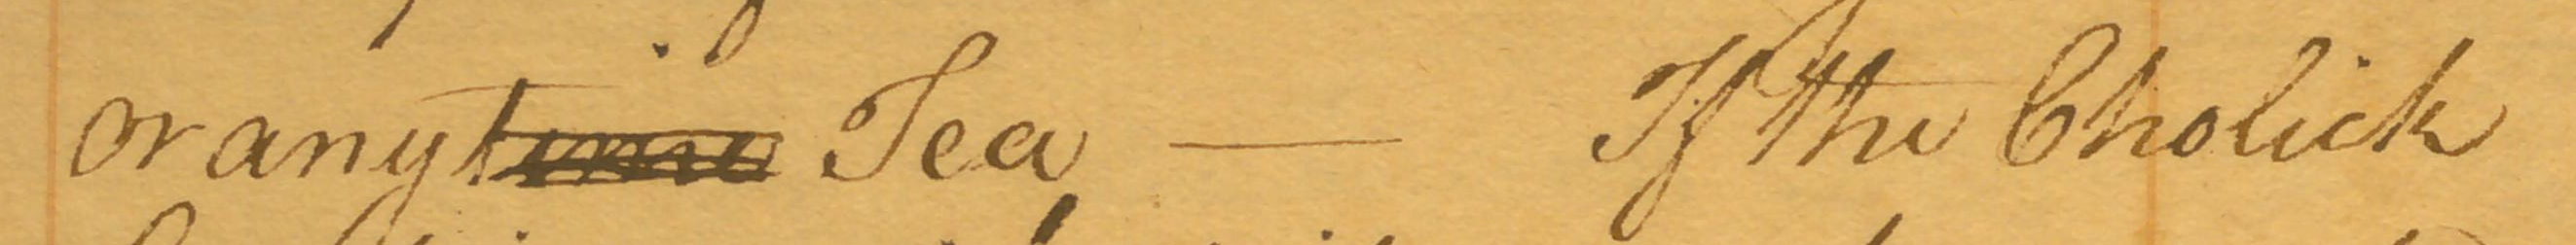or any [time] Tea- If the Cholick
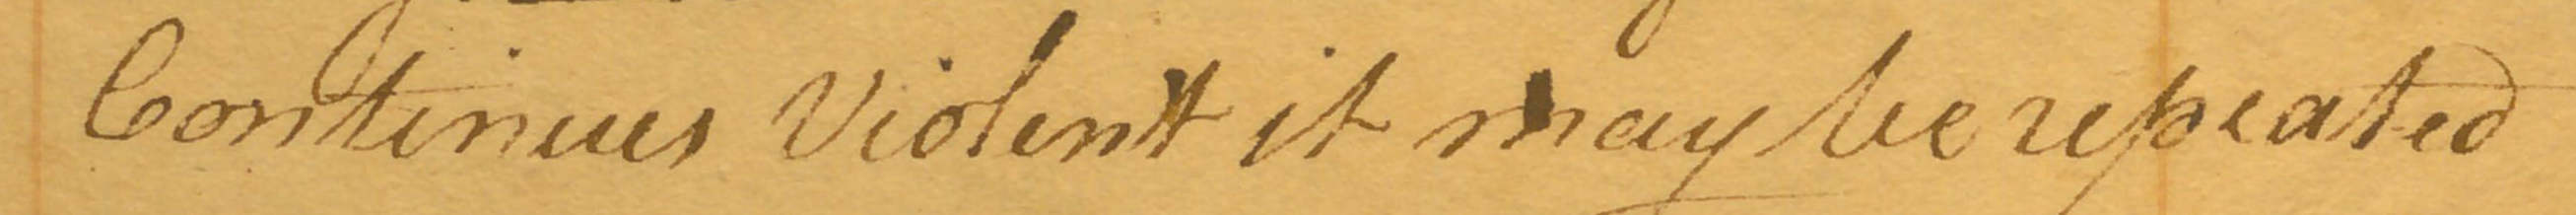Continues violent it may be repeated
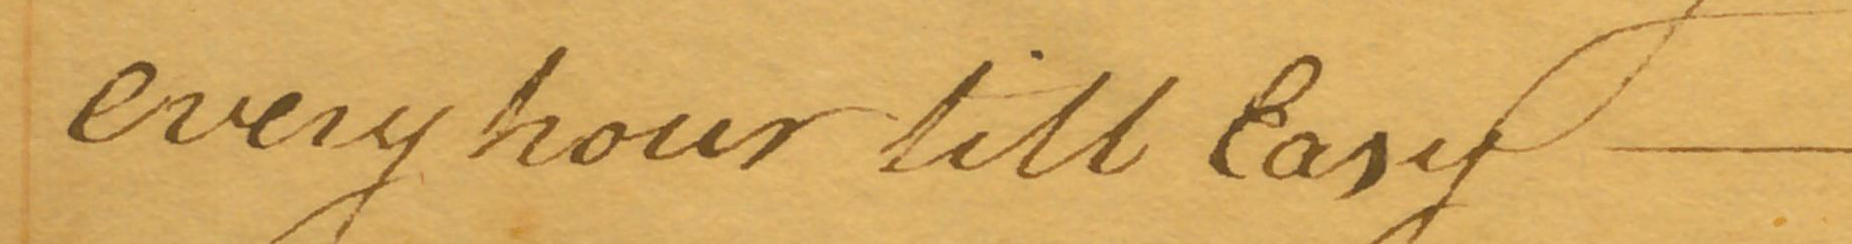every hour till Easy-
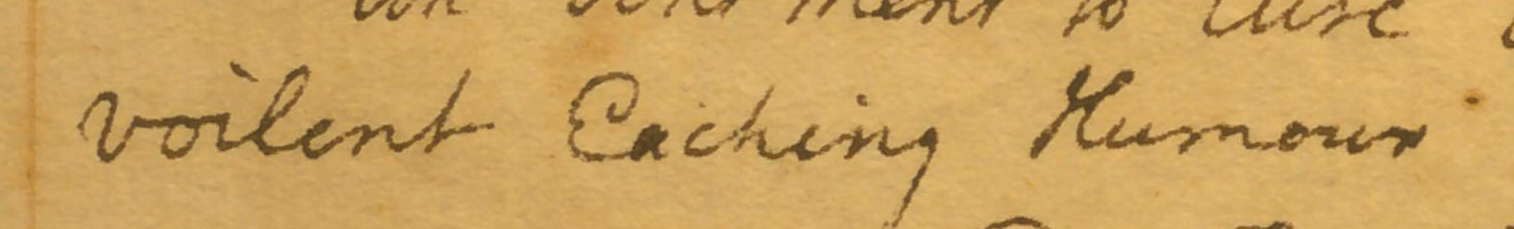violent Eaching Humour
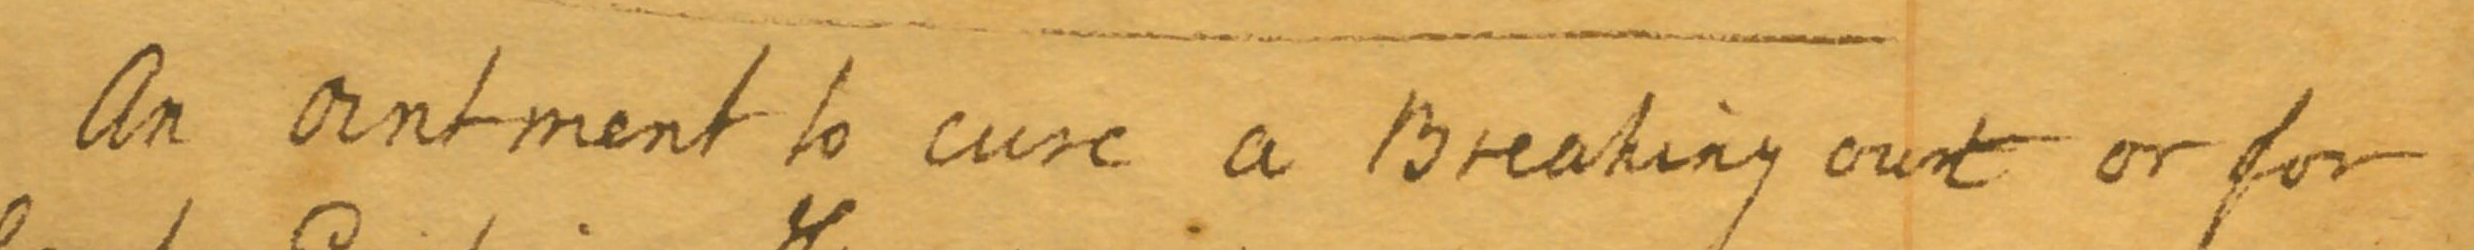An ointment to cure a Breaking out or for
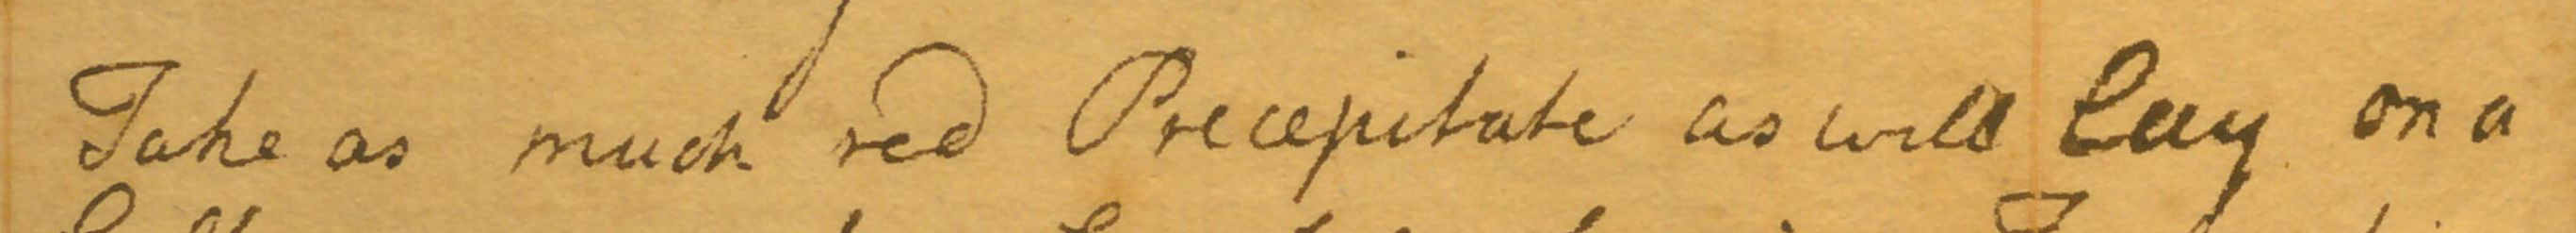Take as much red Precepitate as will lay on a
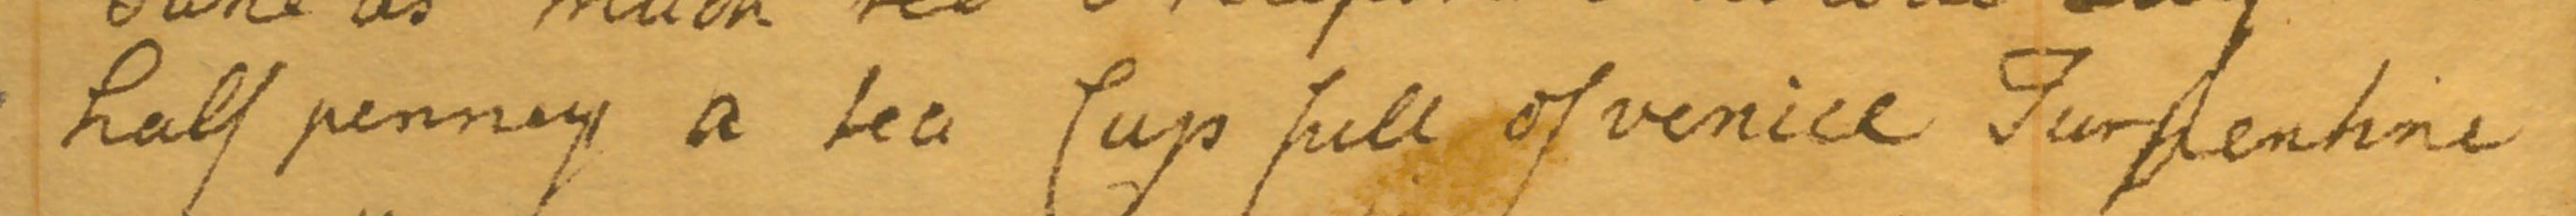half penney a tea Cup full of vine Turpentine
